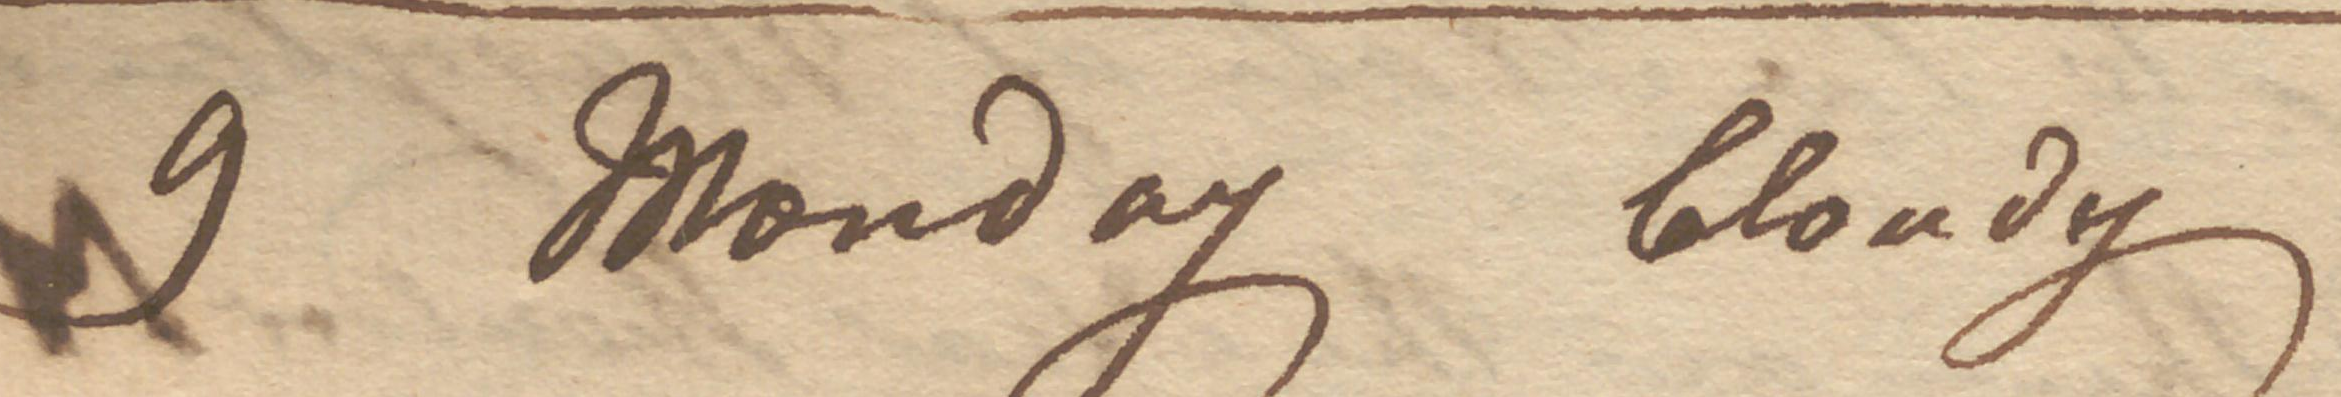Monday Cloudy
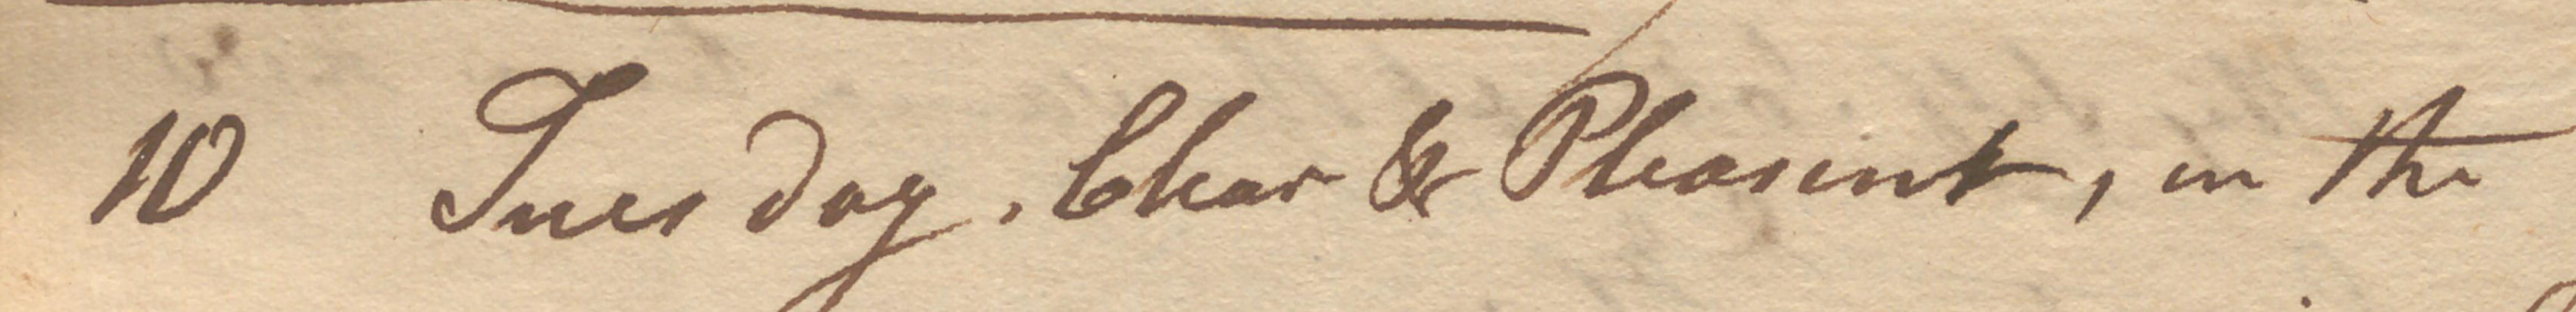10 Tuesday. Clear & Pleasent, in the
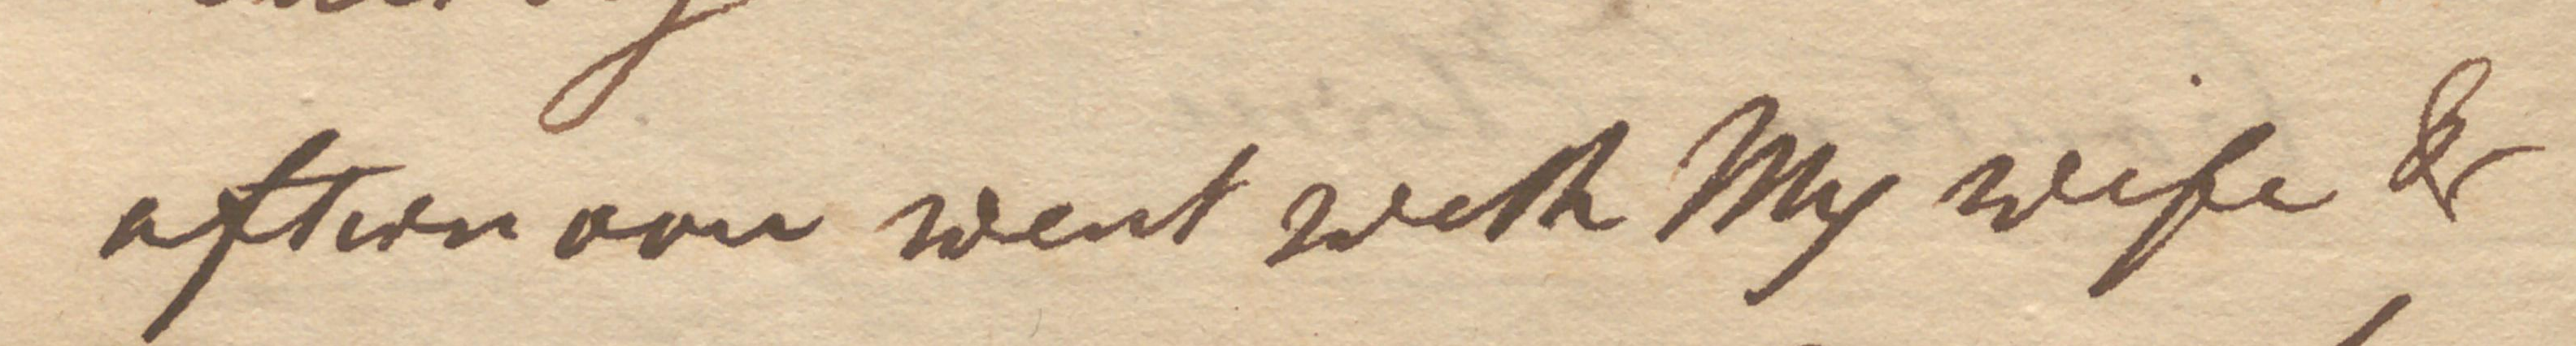afternoon went with My wife &
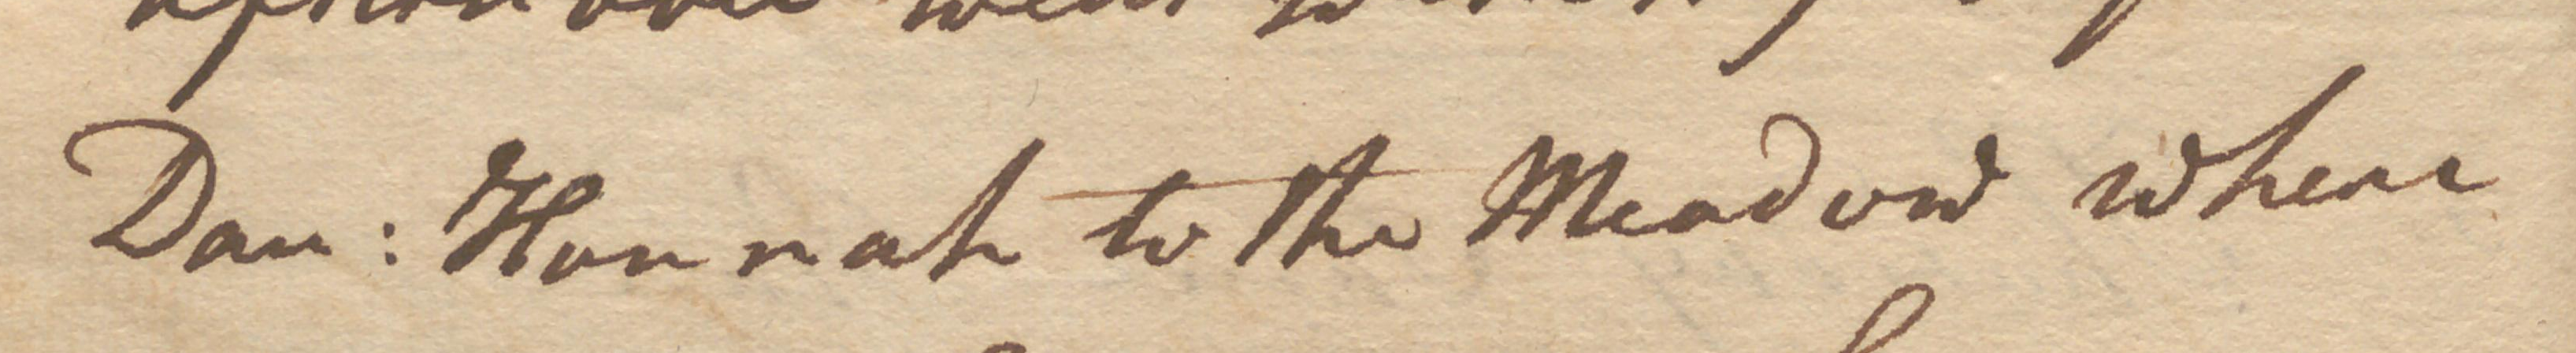Dau: Hannah to the Meadow where
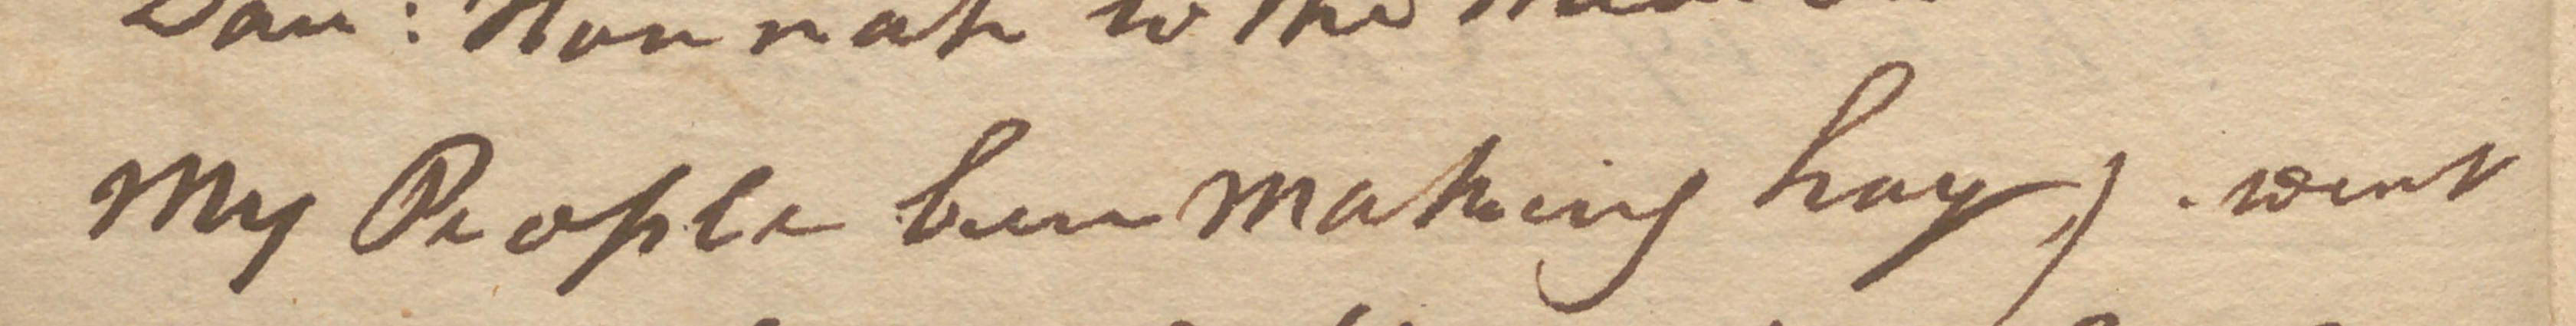My People been making hay) went
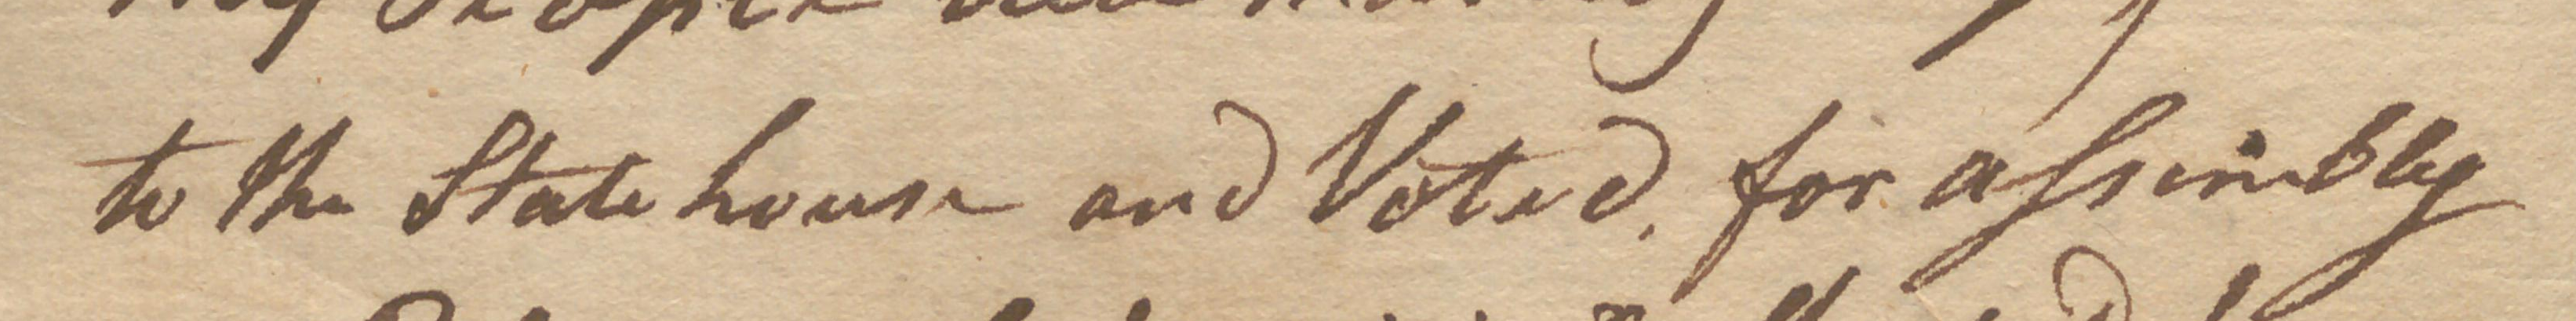to the State house and Voted for assembly
